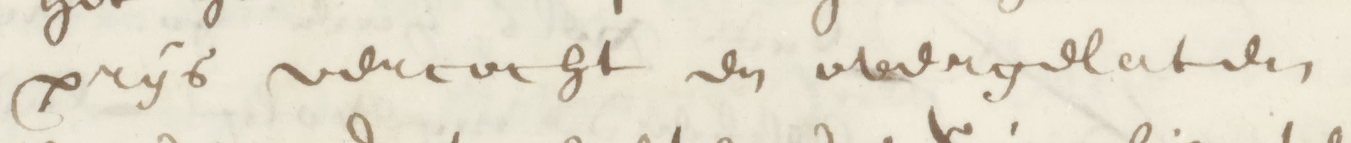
prijs vercocht en overgelaten
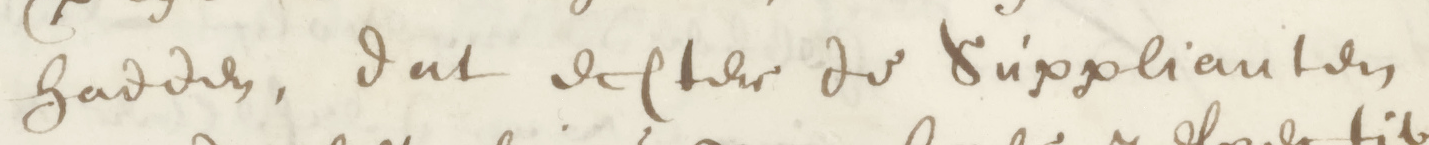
hadden, dat echter de Supplianten
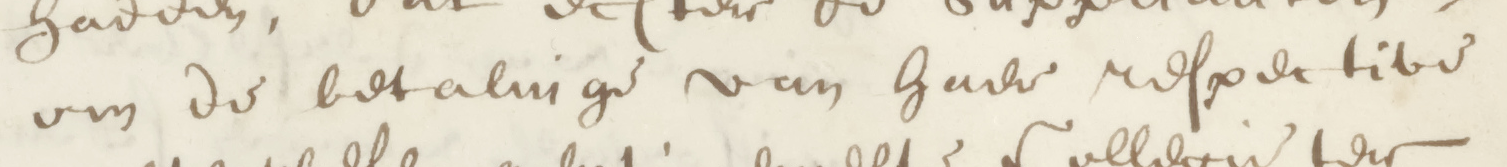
om de betalinge van haer respective
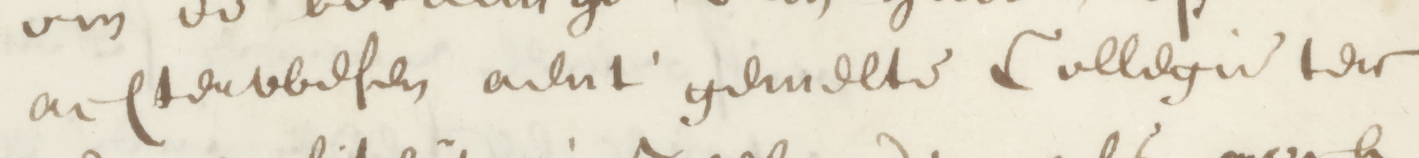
achterwesen aent' gemelte Collegie ter
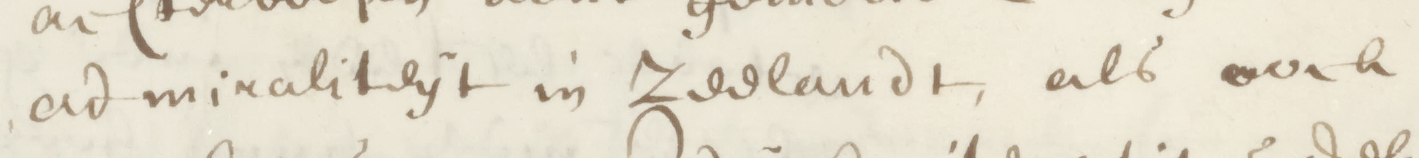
admiraliteijt in Zeelandt, als oock
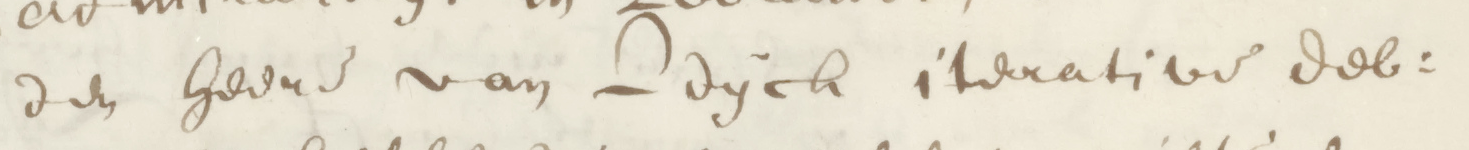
den heere van Odijck iterative deb:
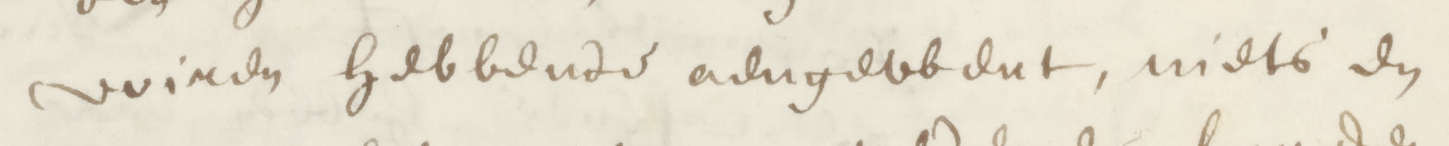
voiren hebbende aengewent, niets en
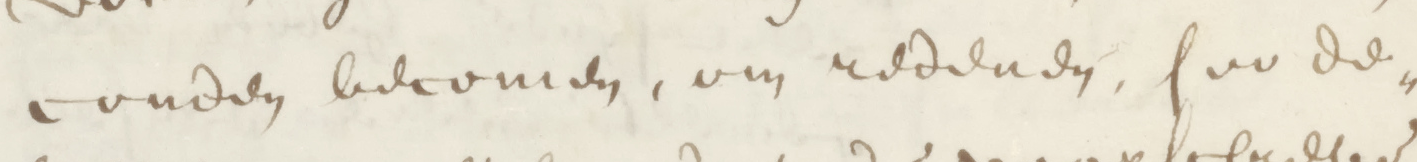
conden becomen, om redenen, soo de
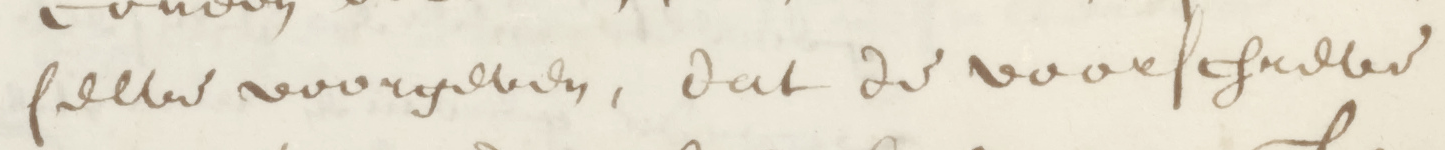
selve voorgeven, dat de voorschreve
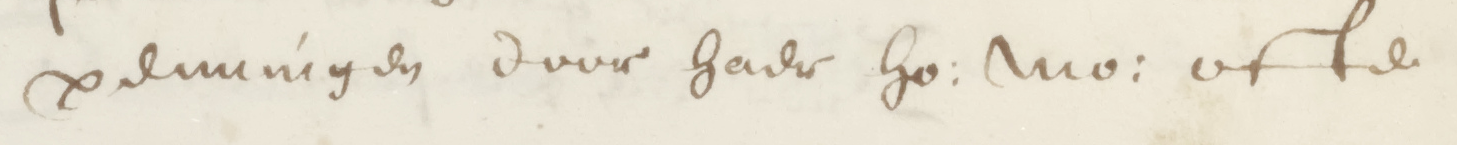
penningen door haer ho:mo: ofte
